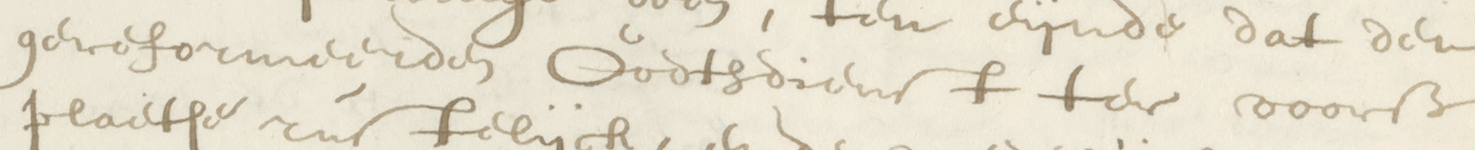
gereformeerden Godtsdienst ter voors
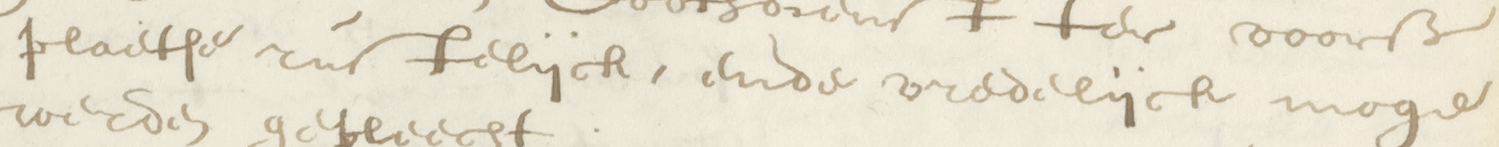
plaetse rustelijck, ende vredelijck moge
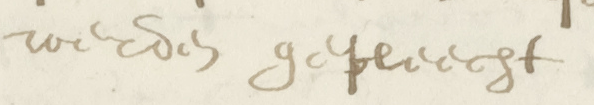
werden gepleecht
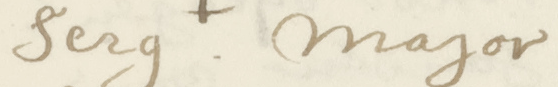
Sergt. Major
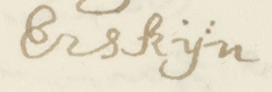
Erskijn
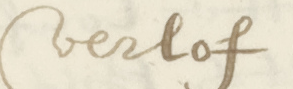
verlof
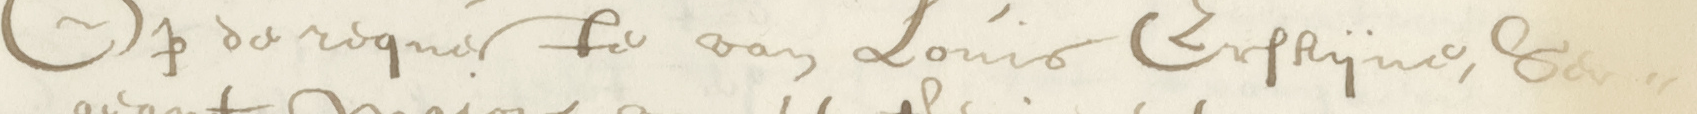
Op de requeste van Louis Erskijne, Se,r,
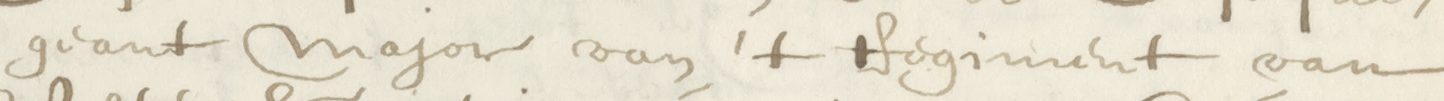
geant major van ‛t Regiment van
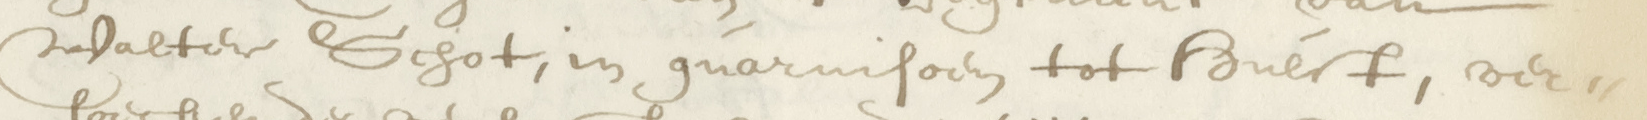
Walter Schot, in guarnisoen tot Hulst, ver„
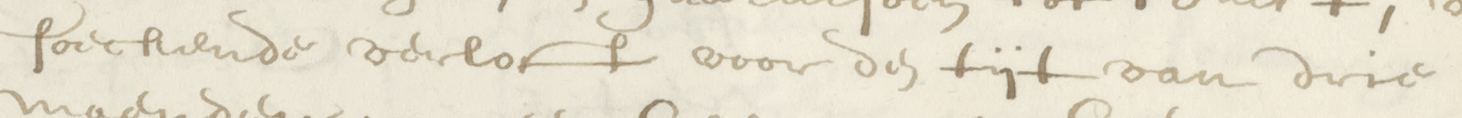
soeckende verloff voorden tijt van drie
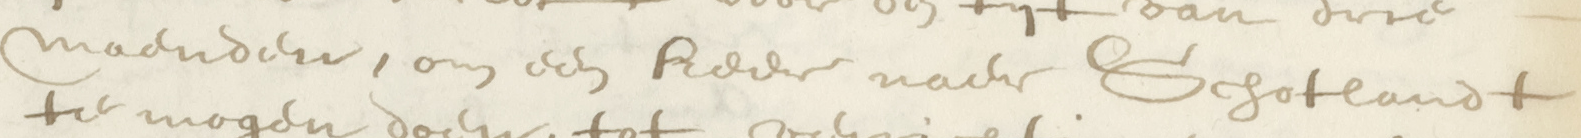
maenden, om een keer naer Schotlandt
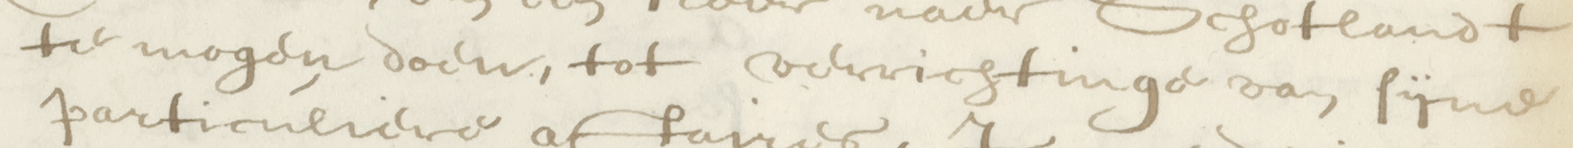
te mogen doen, tot verrichtinge van sijne
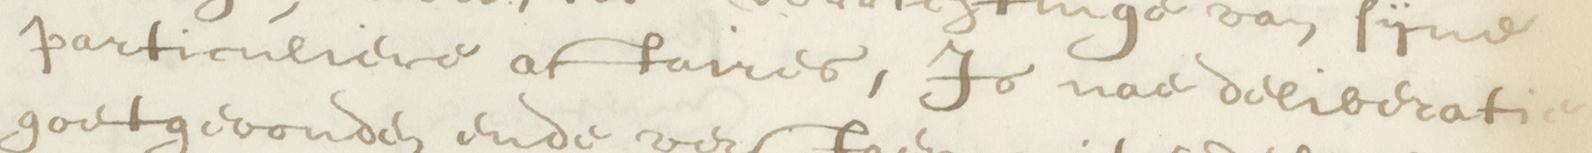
particuliere affaires, Is nae deliberatie
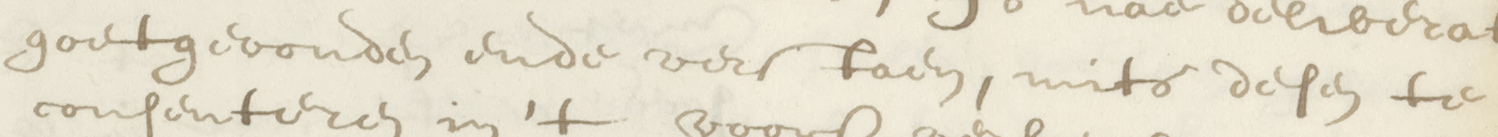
goetgevonden ende verstaen, mits desen te
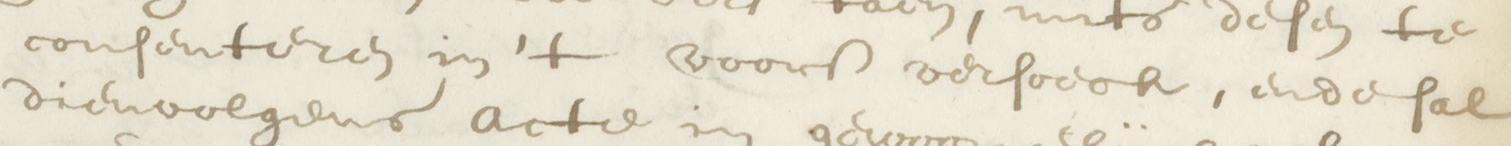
consenteren in t voors versoeck, ende sal
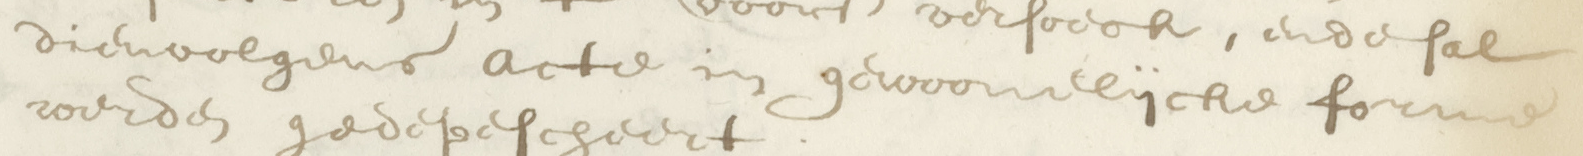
dienvolgens acte in gewoonelijcke forme
